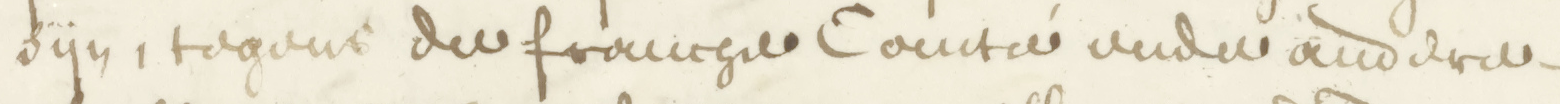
sijn, tegens de franche Comté ende andere
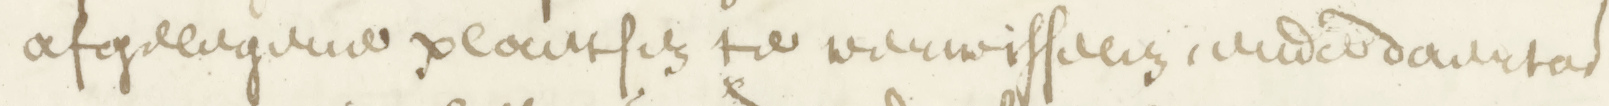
afgelegene plaetsen te verwisselen, ende daertoe
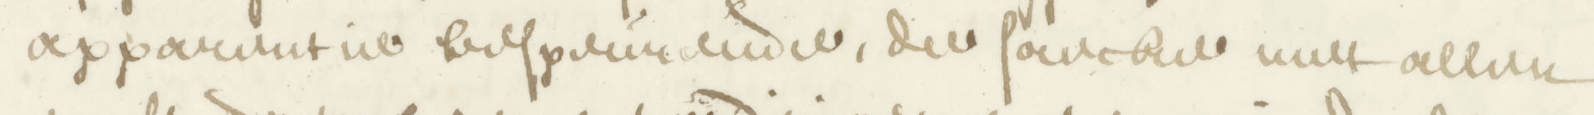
apparentie bespeurende, de saecke met allen
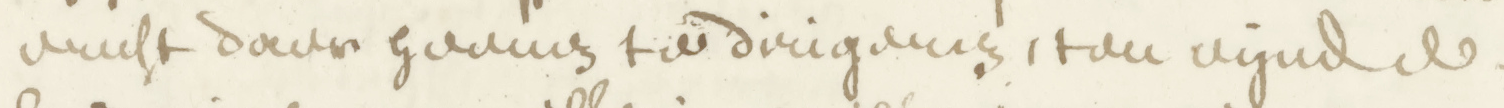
ernst daer heenen te dirigeren, ten eijnde de
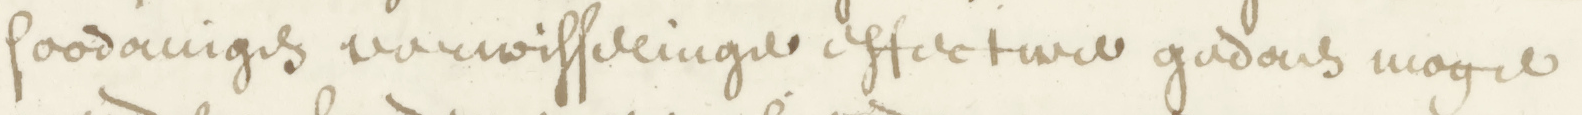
soodanigen verwisselinge effective gedaen moge
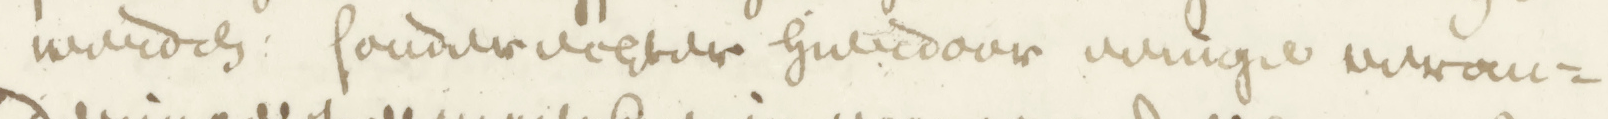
werden: sonder echter hierdoor eenige veran=
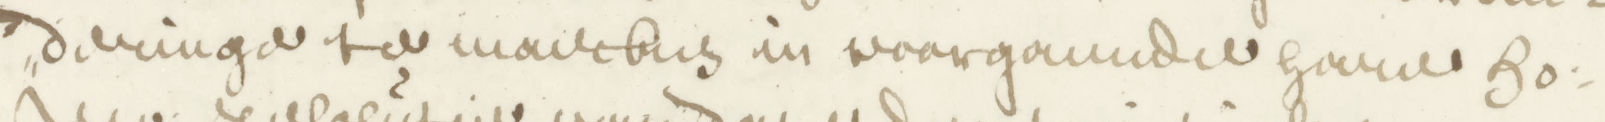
„deringe te maecken in voorgaende hare Ho:
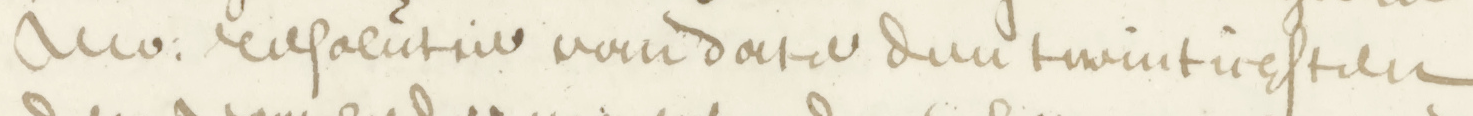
Mo: resolutie van date den twintichsten
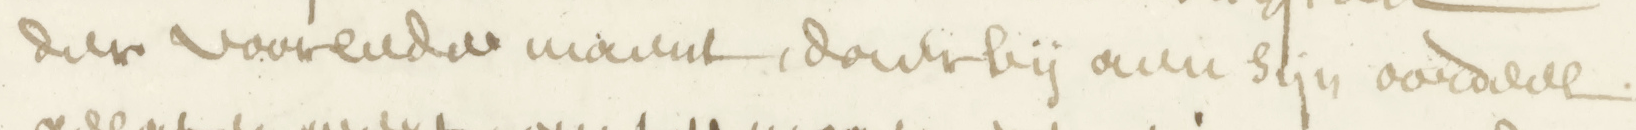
der voorlede maent, daerbij aen sijn oordeel
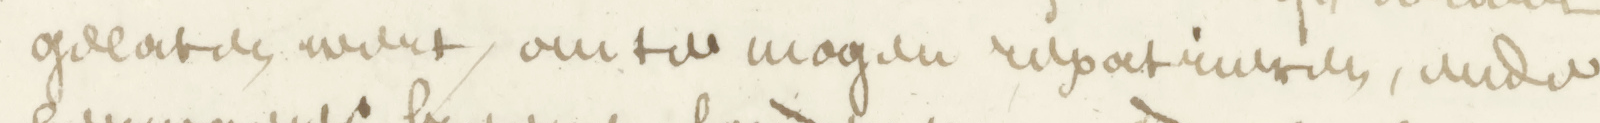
gelaten wert, om te mogen repatrieren, ende
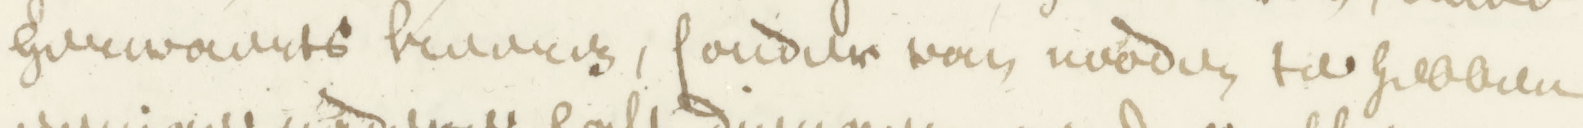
herwaerts keeren, sonder van nooden te hebben
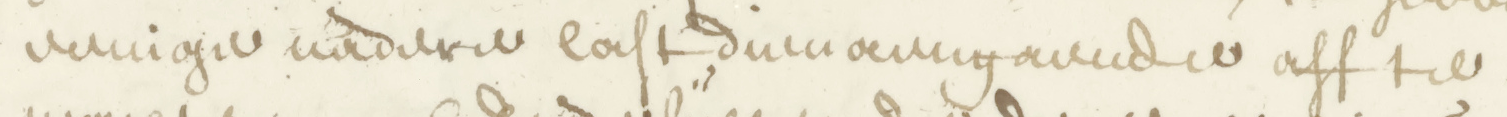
eenige nadere last dienaengaende aff te
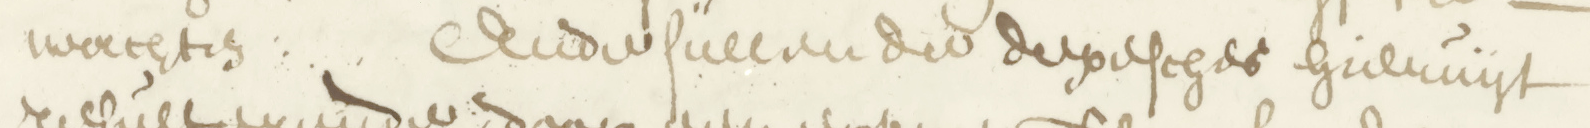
wachten: Ende sullen de depesches hieruijt
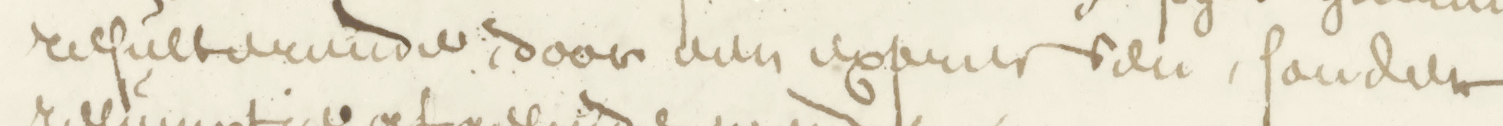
resulterende, door een expressen, sonder
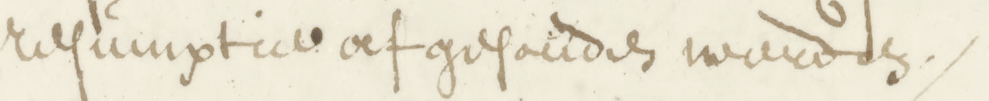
resumptie afgesonden werden.
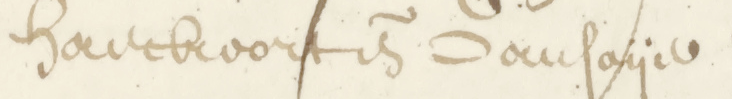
Haeckoort en Gansoije
